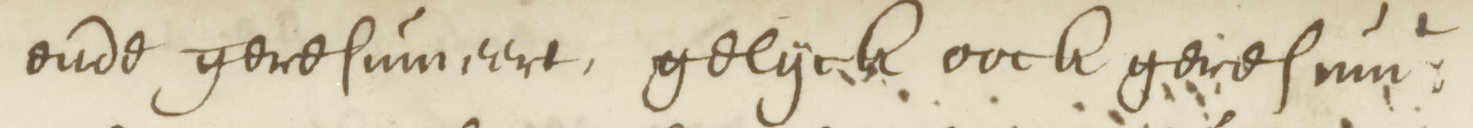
ende geresumeert, gelijck oock geresumt:
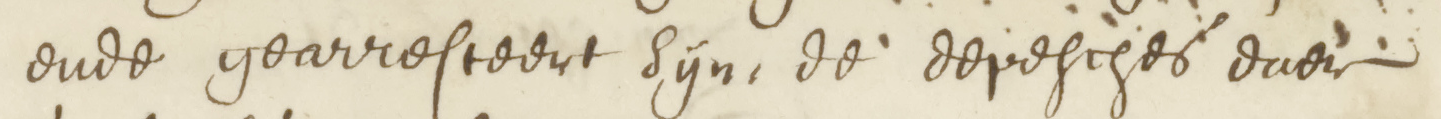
ende gearresteert sijn, de depesches daer
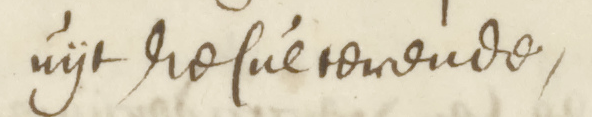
uijt resulterende,
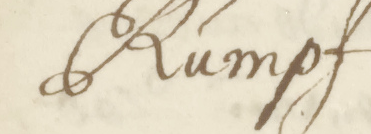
Rumpf
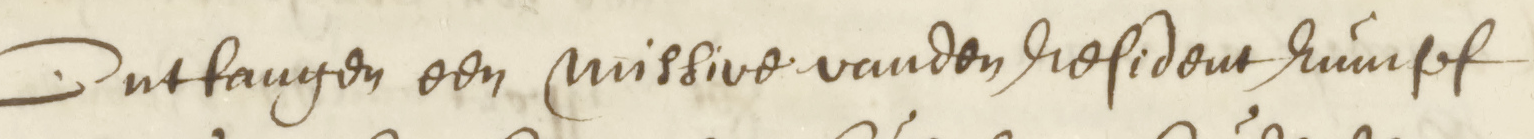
Ontfangen een missive vanden resident rumpf
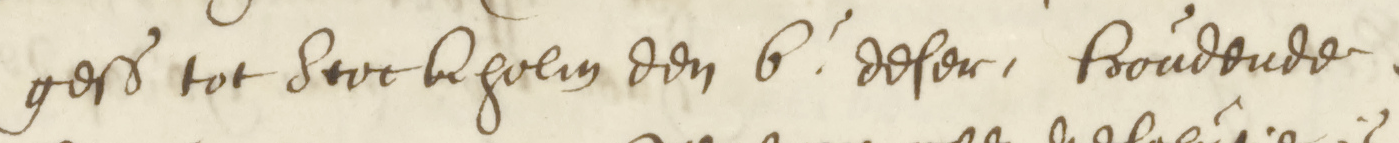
gesr tot Stockholm den Ve. deser, houdende
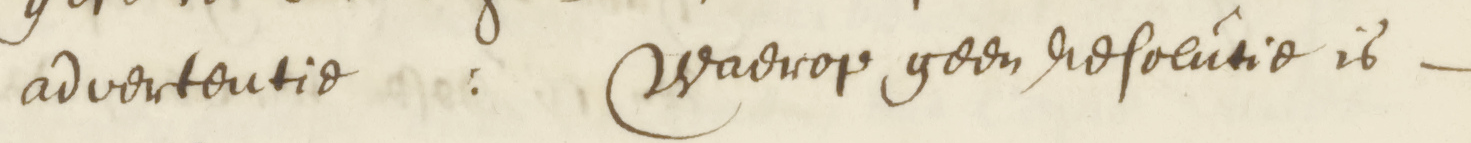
advertentie: Waerop geen resolutie is
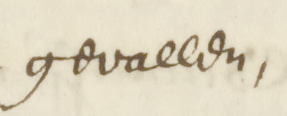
gevallen.
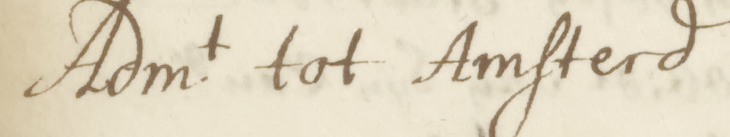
Admt. tot Amsterd.
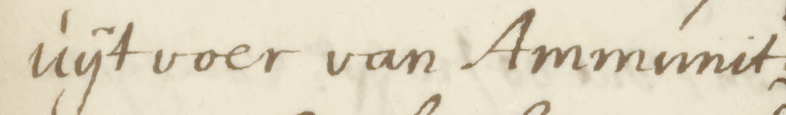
uijtvoer van Ammunitie
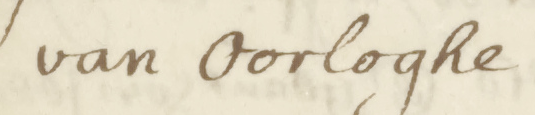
van Oorloghe
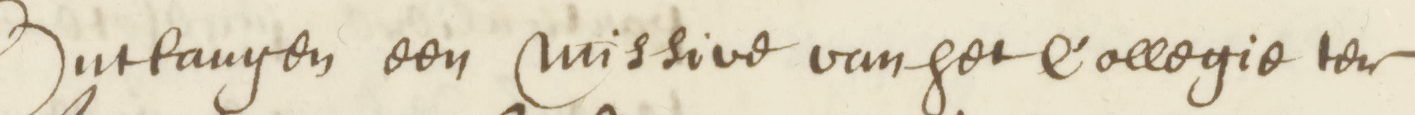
Ontfangen een missive van het Collegie ter
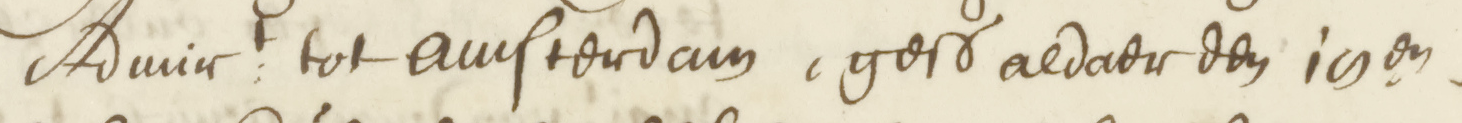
Admirt: tot Amsterdam, gesr aldaer den 18en
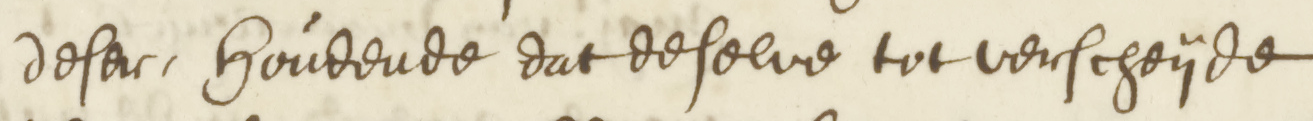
deser, houdende dat deselve tot verscheijde
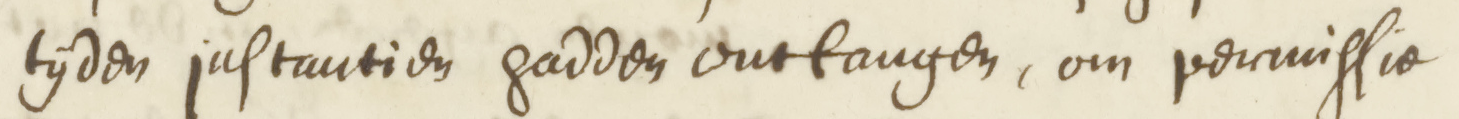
tijden instantien hadden ontfangen, om permissie
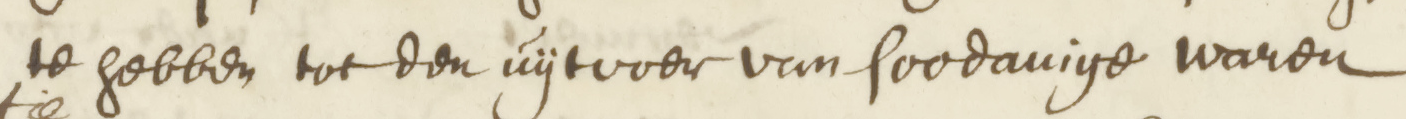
te hebben tot den uijtvoer van soodanige waren
